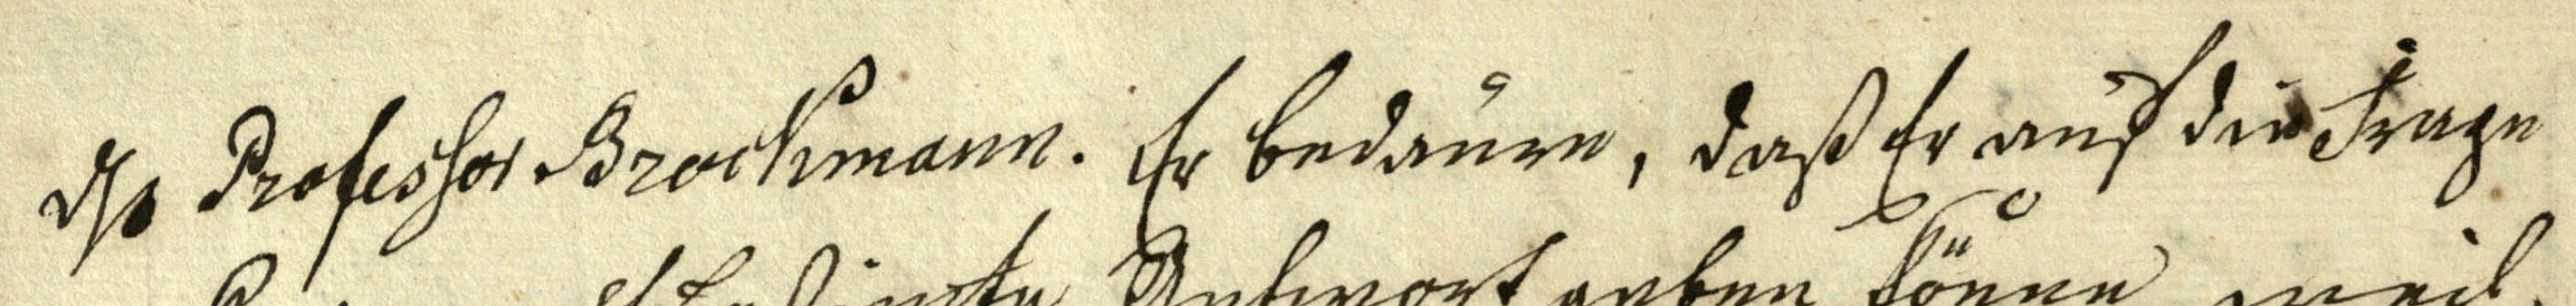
dh Professor Brockmann. Er bedaure, daß Er auf die Frage
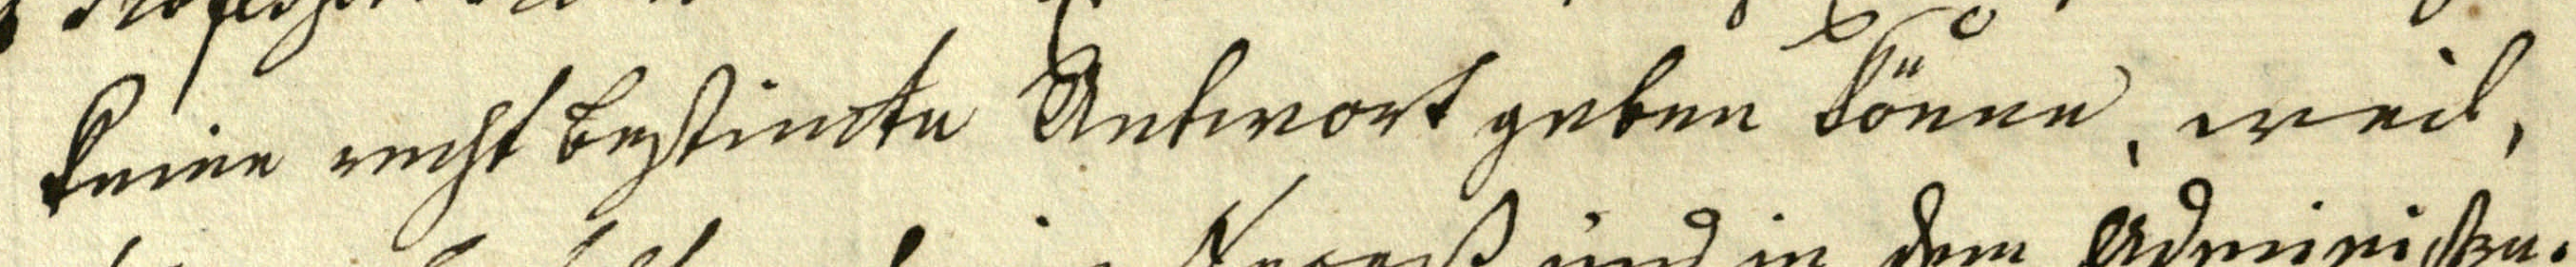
keine recht bestimte Antwort geben könne, weil,
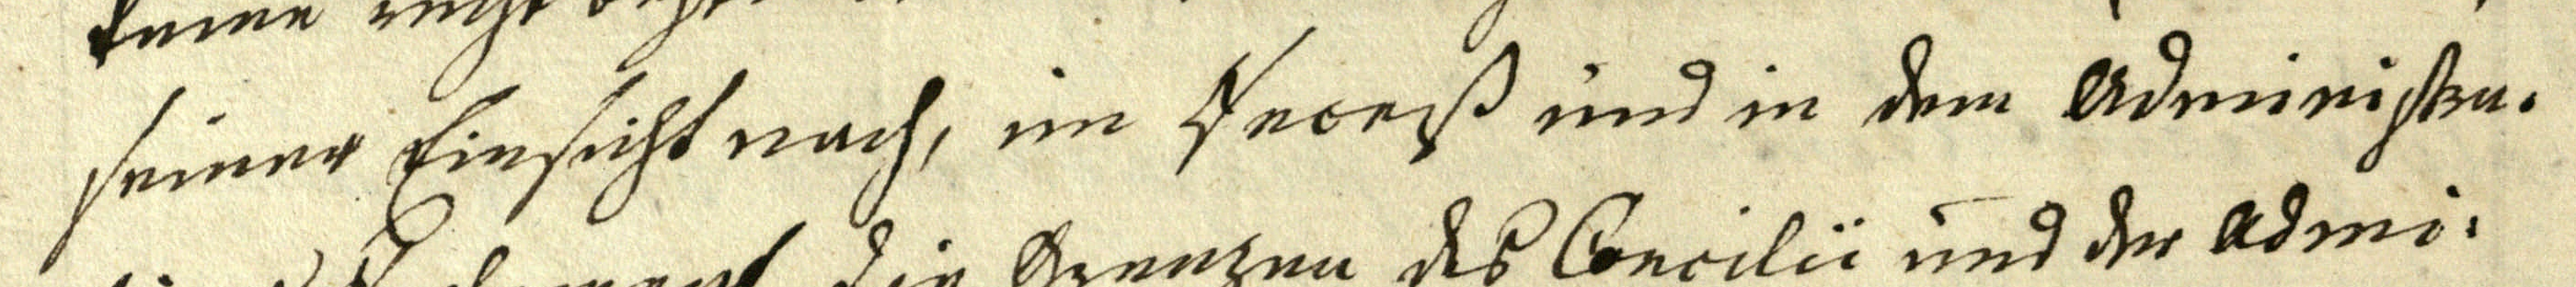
seiner Einsicht nach, im Receß und in dem Administra¬
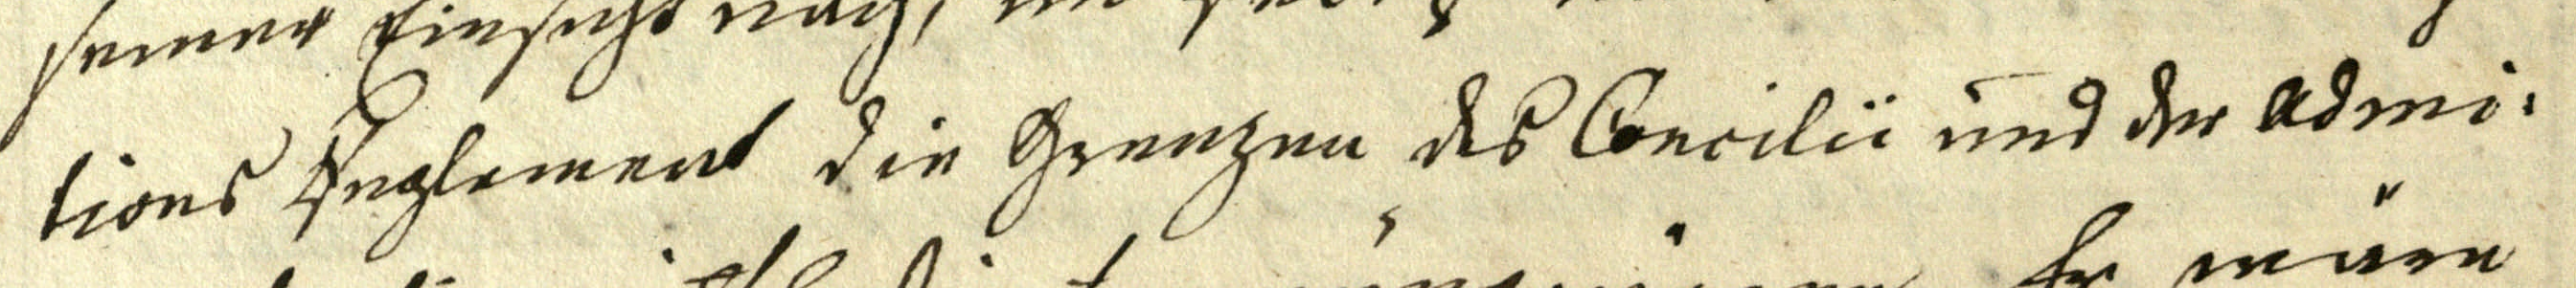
tions Reglement die Grenzen des Concilii und der Admi¬
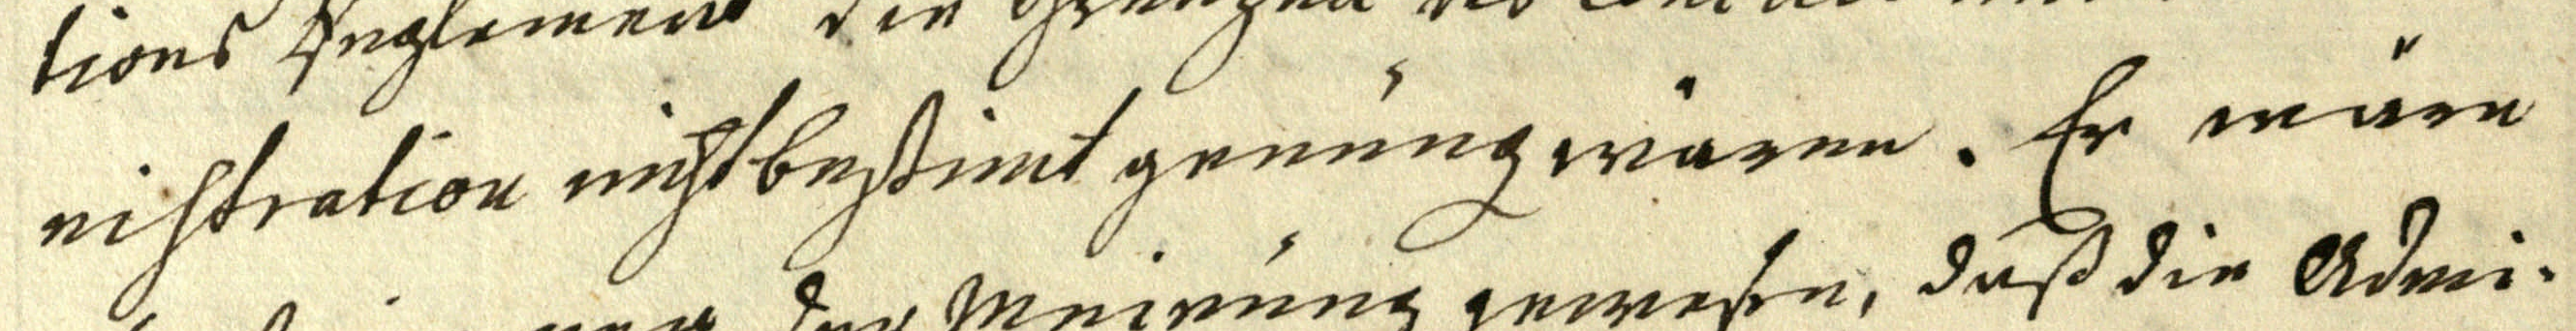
nistration nicht bestimt genung wären. Er wäre
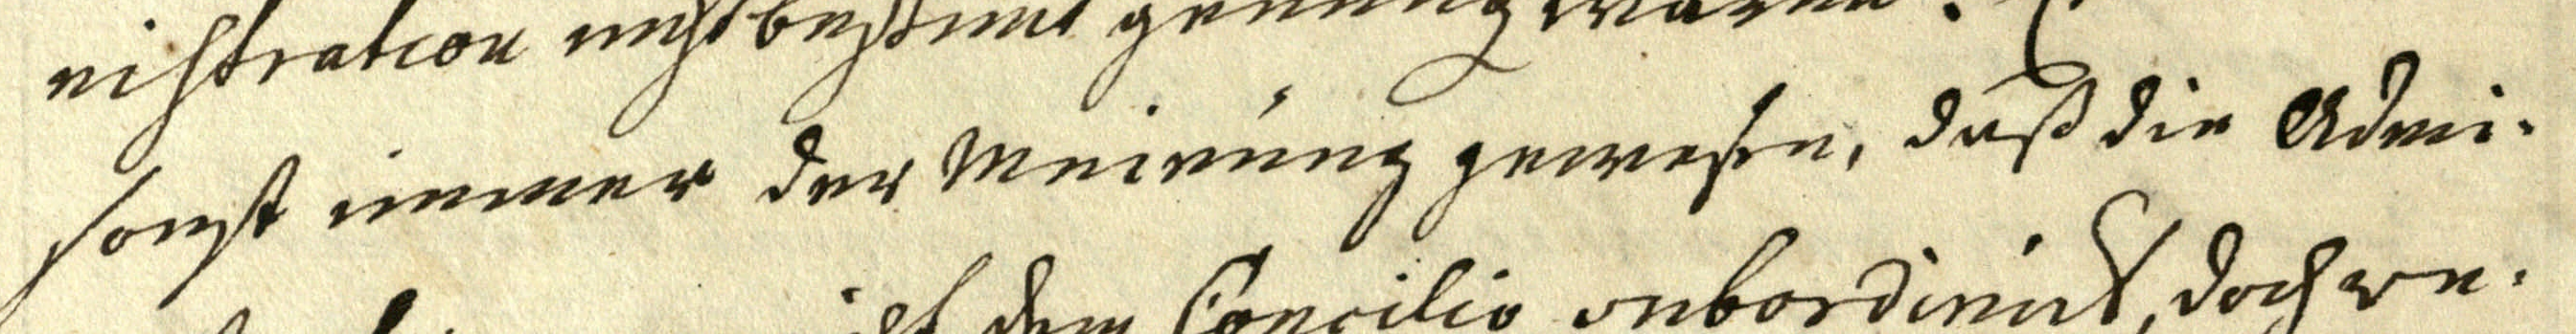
sonst immer der Meinung gewesen, daß die Admi¬
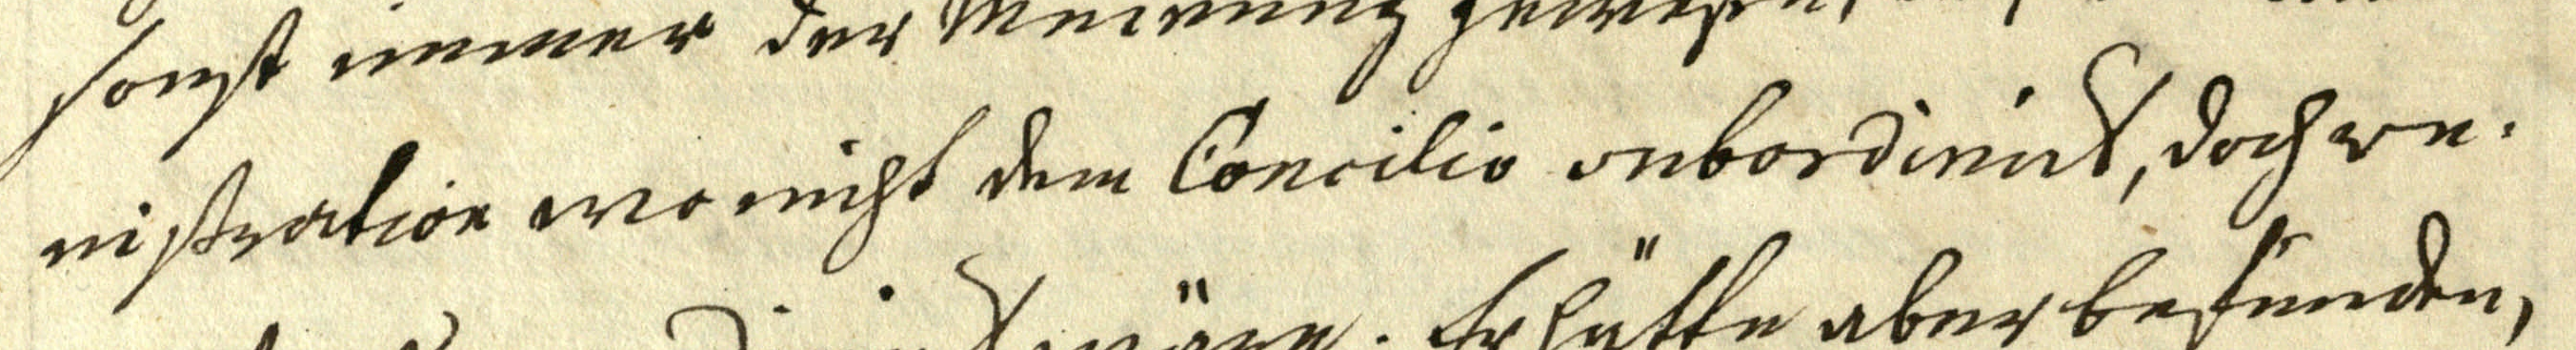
nistration wo nicht dem Concilio subordinirt, doch we¬
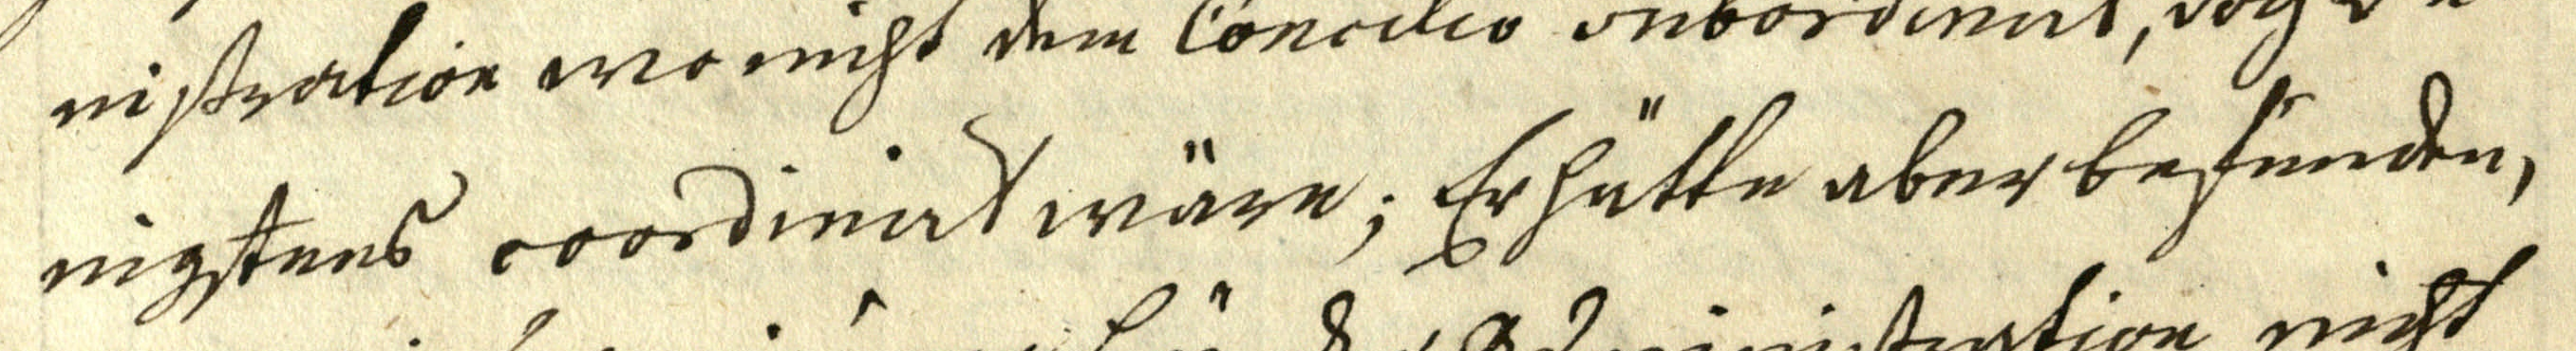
wenigstens coordinirt wäre, Er hätte aber befunden,
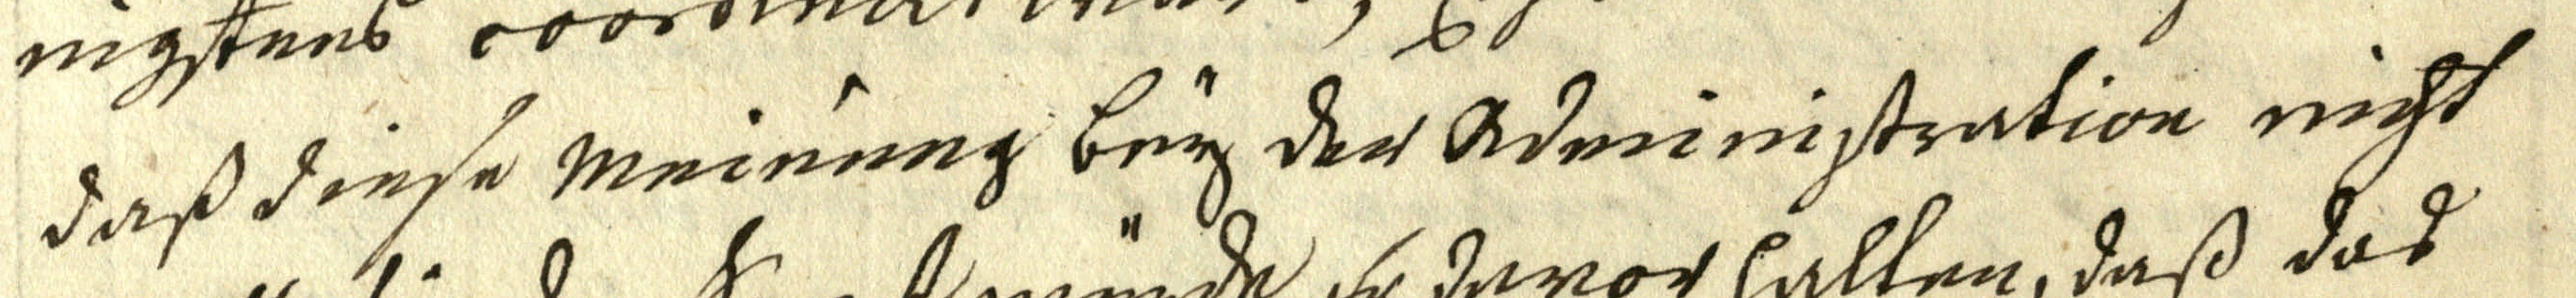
daß diese Meinung beÿ der Administration nicht
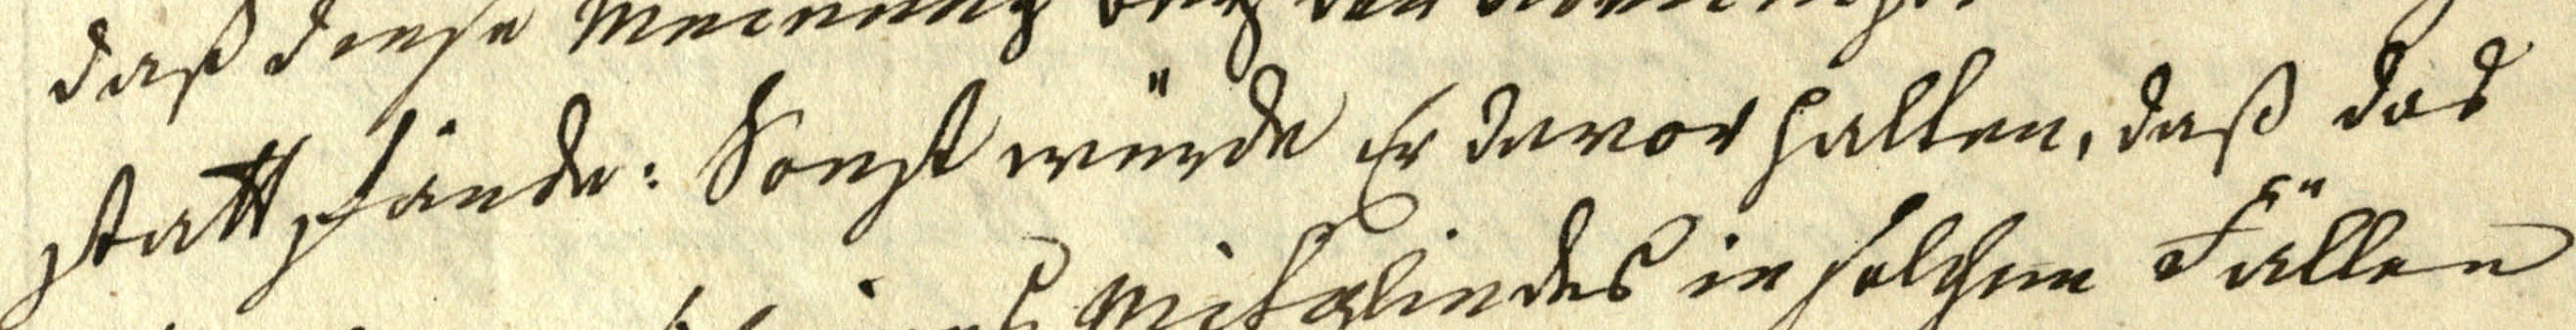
statt fände: Sonst würde Er davor halten, daß das
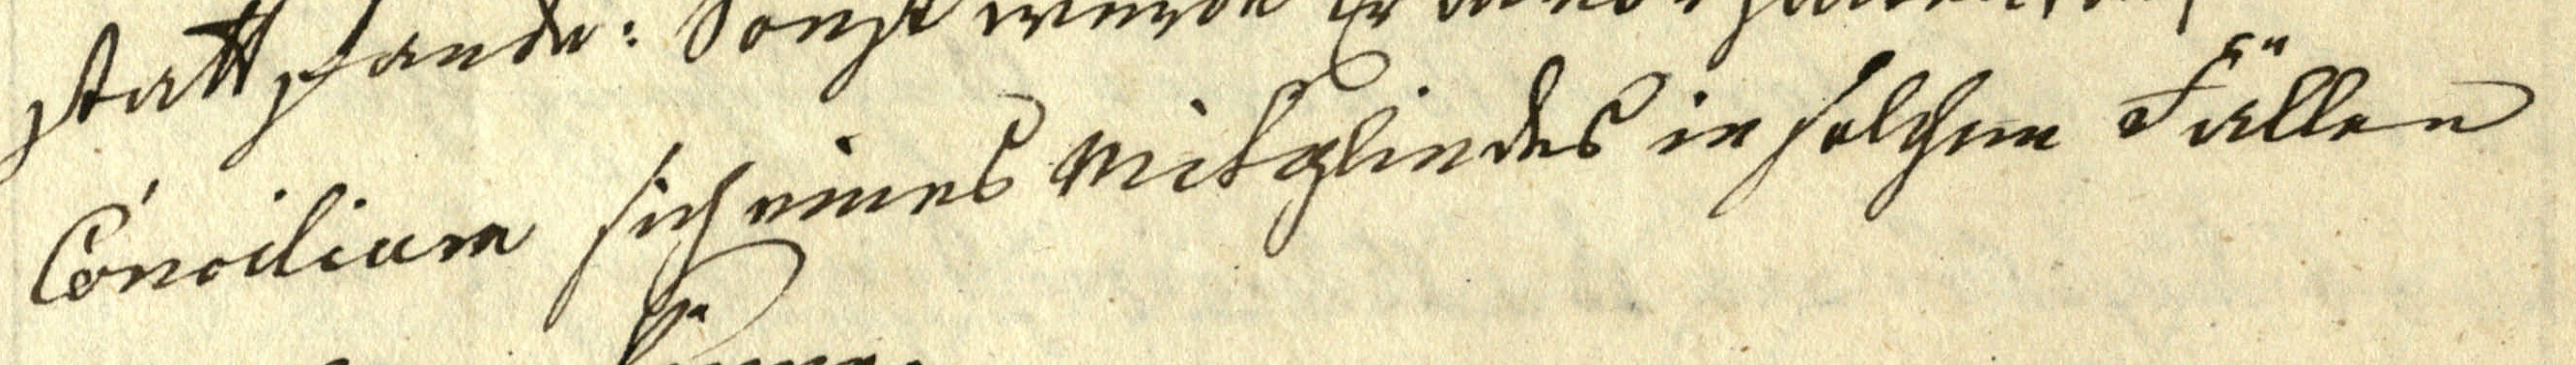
Concilium sich eines Mitgliedes in solchen Fällen
